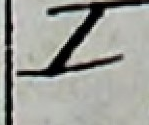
I
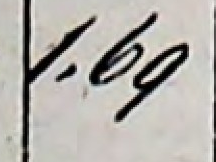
1,69
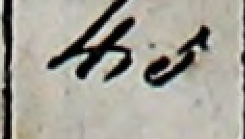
4,5
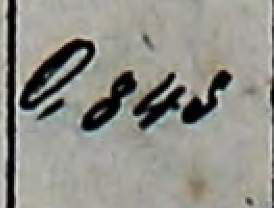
0,845
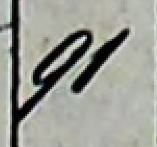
91
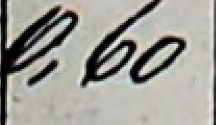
0,60
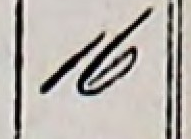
16
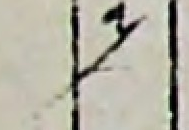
7
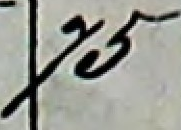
75
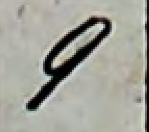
9
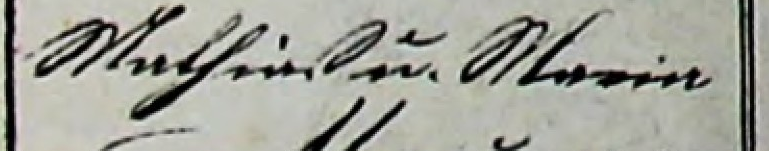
Mathias u. Maria
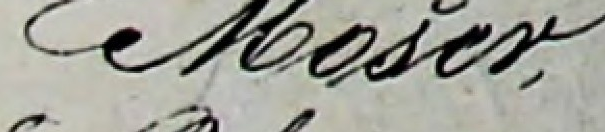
Meser,
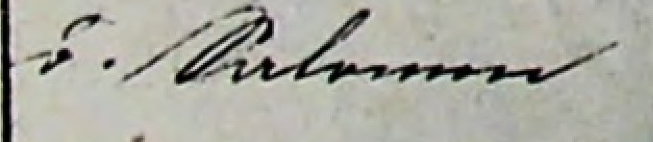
v. Salemm
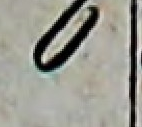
6
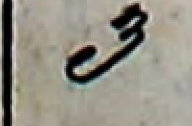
3
